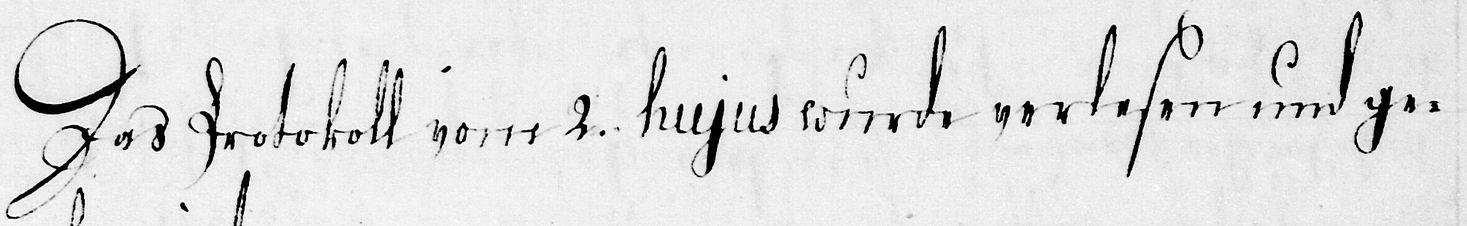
Das Protokoll vom 2. hujus wurde verlesen und ge¬
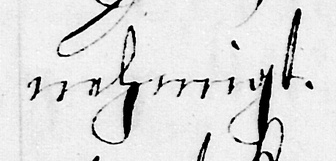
nehmigt.
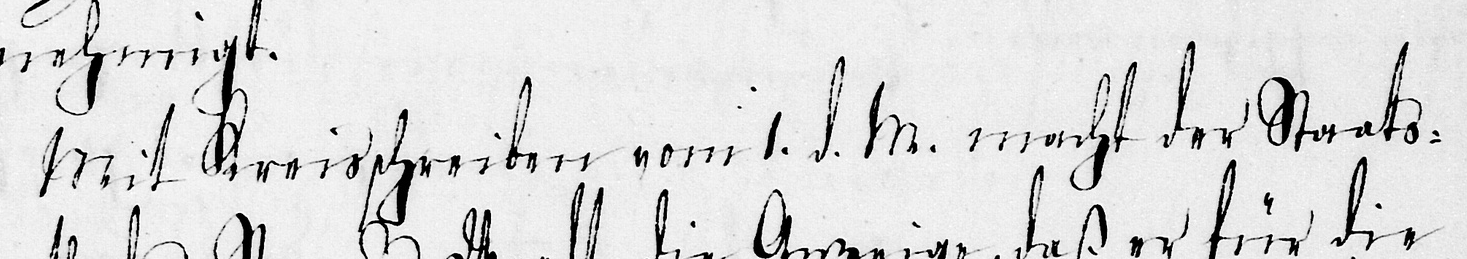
Mit Kreisschreiben vom 1. d. M. macht der Staats¬
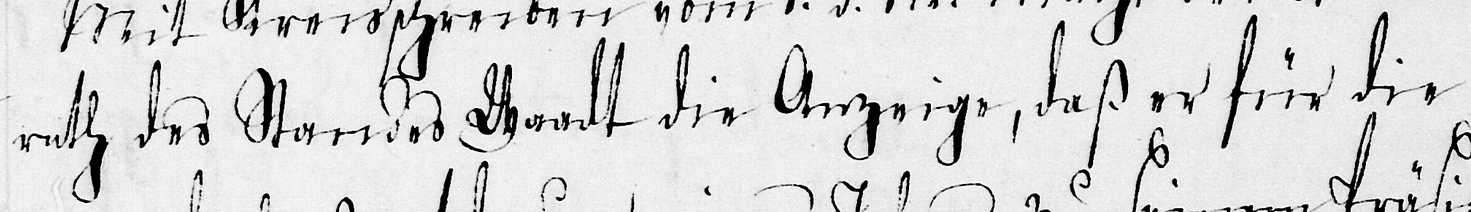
rath des Standes Waadt die Anzeige, daß er für die
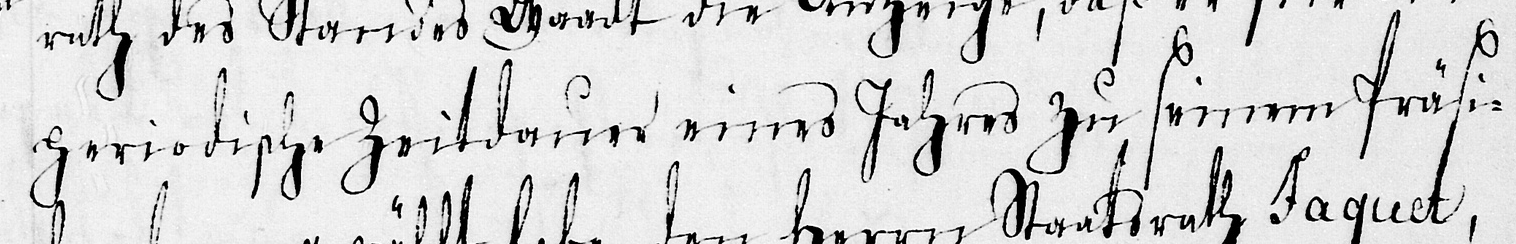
periodische Zeitdauer eines Jahres zu seinem Präsi¬
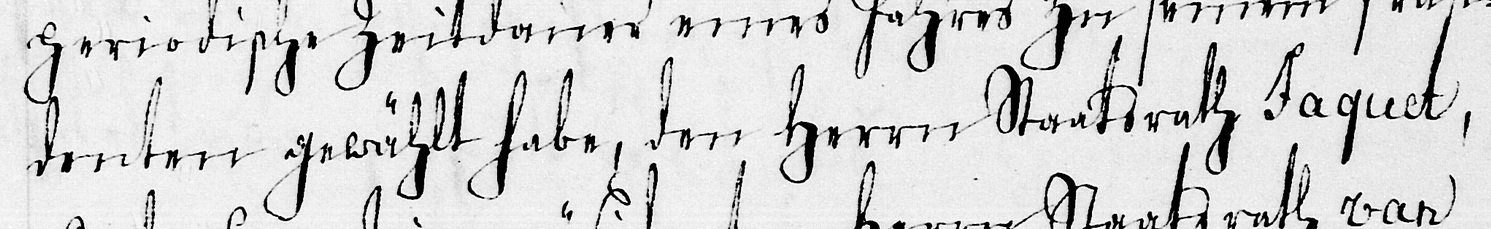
denten gewählt habe, den Herrn Staatsrath Jaquet,
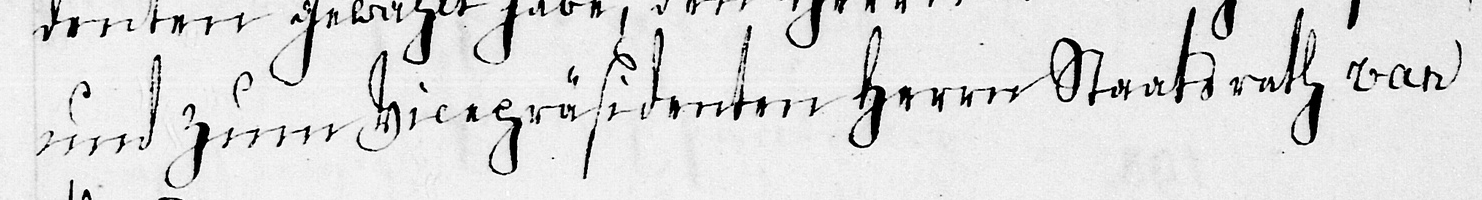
und zum Vicepräsidenten Herrn Staatsrath van
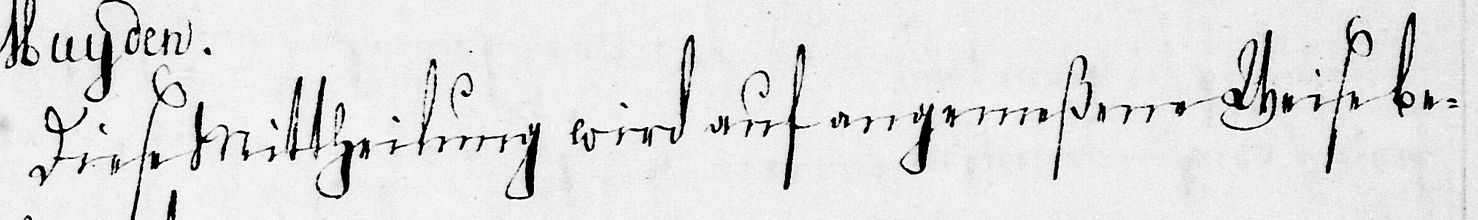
Diese Mittheilung wird auf angemeßene Weise be¬
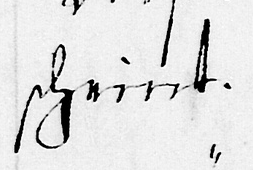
scheint.
